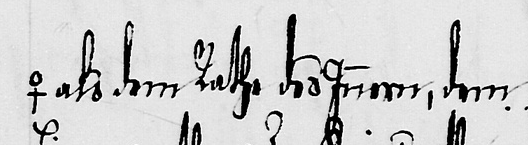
welche nicht vorher an die
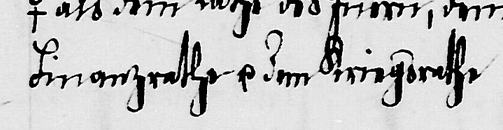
Finanzrathe u. dem Kriegsrath¬
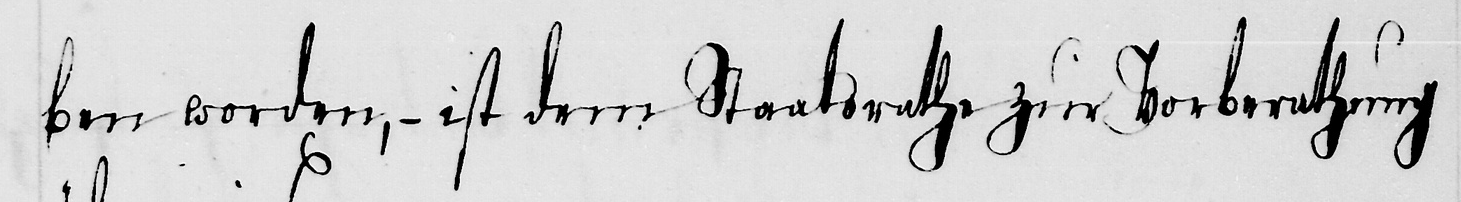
ben worden, – ist dem Staatsrathe zur Vorberathung
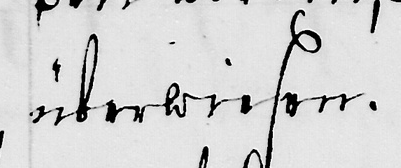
überwiesen.
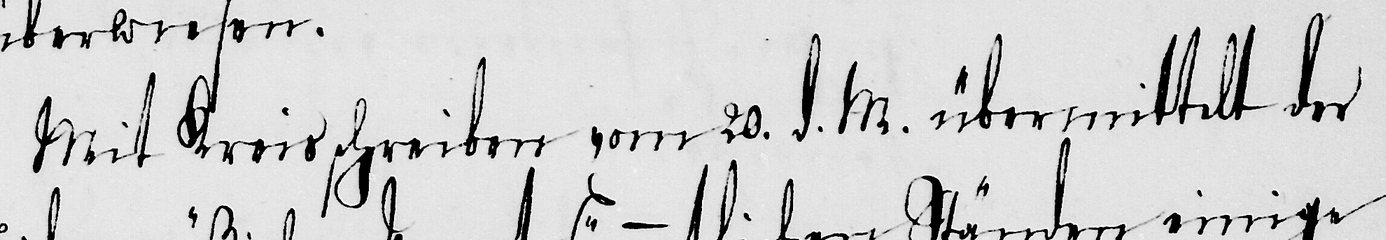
Mit Kreisschreiben vom 20. d. M. übermittelt der
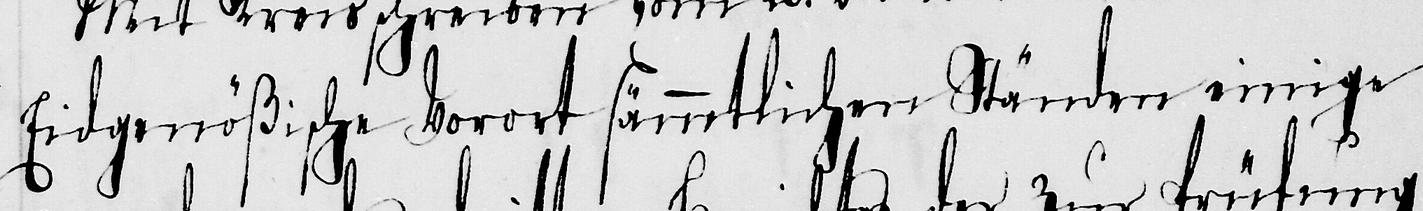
Eidgenößische Vorort sämmtlichen Ständen einige
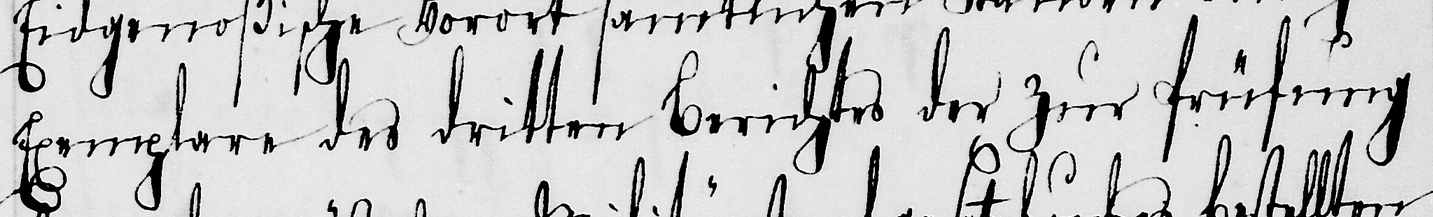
Exemplare des dritten Berichtes der zur Prüfung
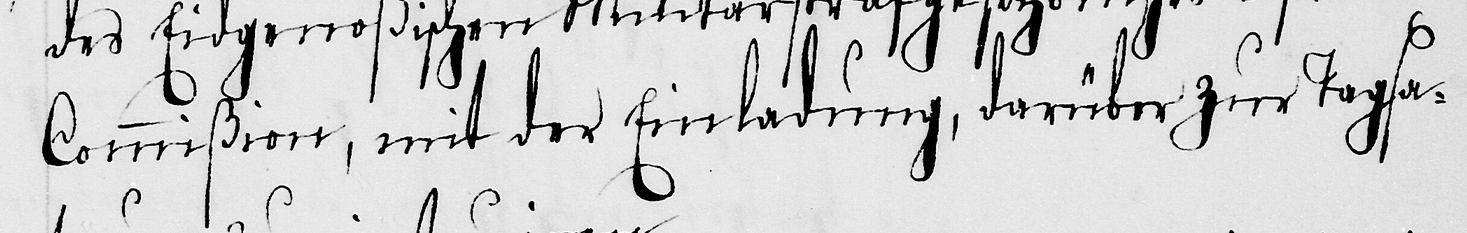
Commißion, mit der Einladung, darüber zur Tagsa¬
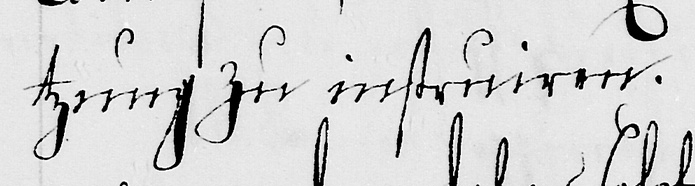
tzung zu instruiren.
